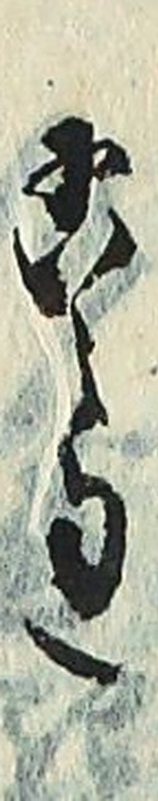右之通
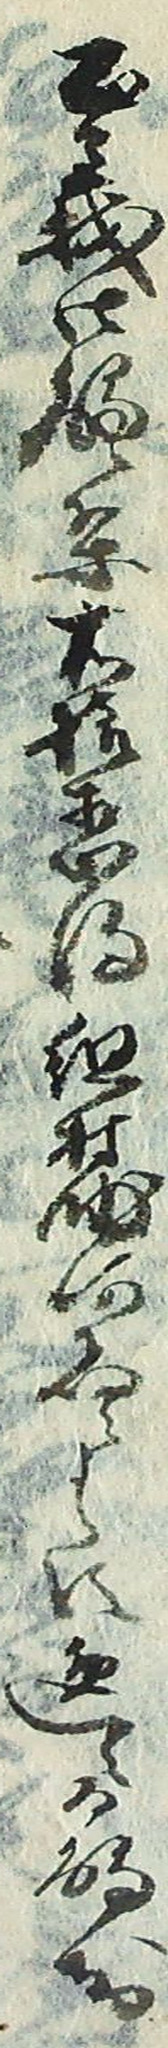公義御触候条右様相心得組村浦何者によらす逸々為触知
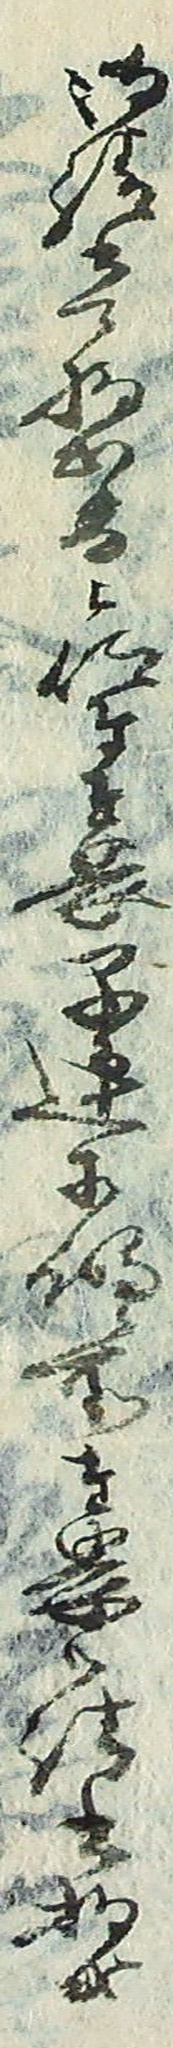御請書可指出旨被仰付奉畏早速相触候所奉畏御請書指出
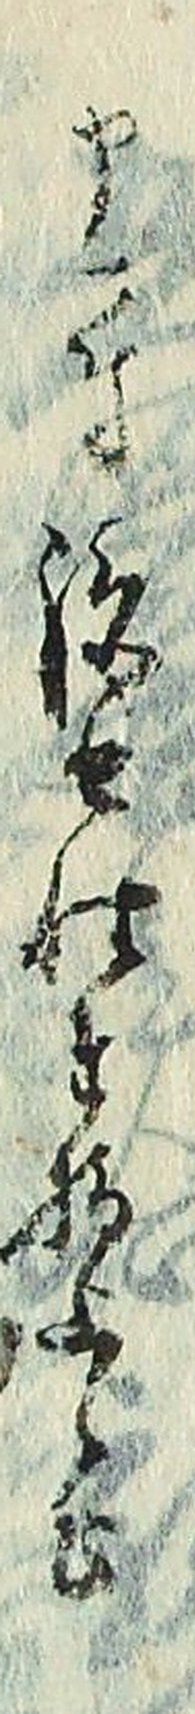申に付添書仕奉指上候以上
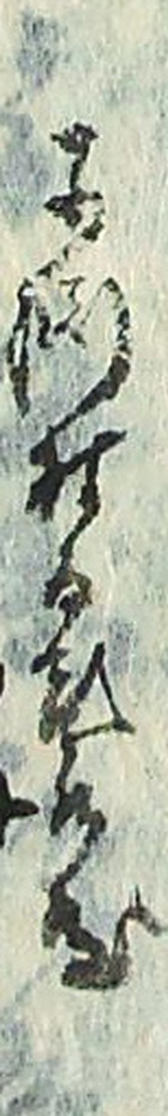早淵村与頭庄屋
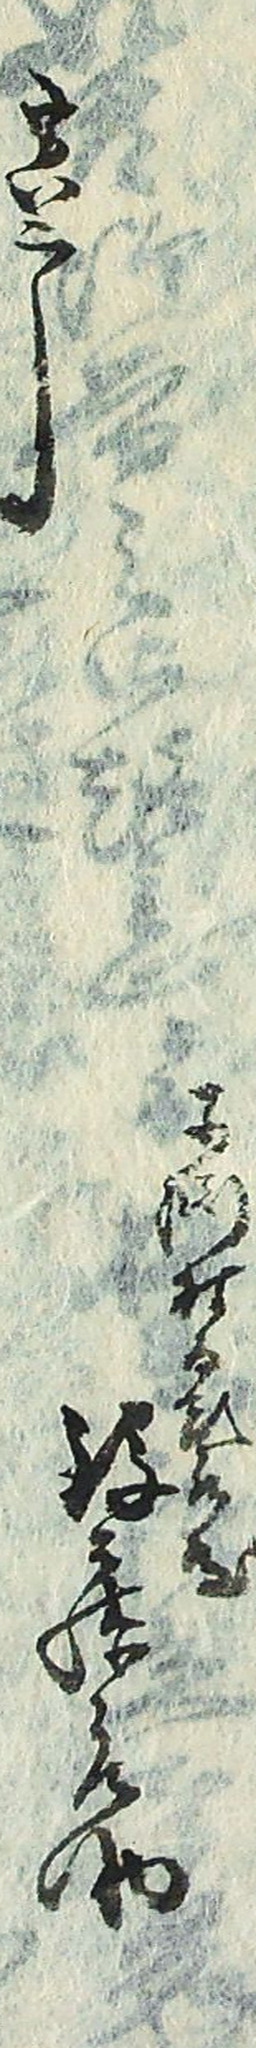寅二月後藤庄助
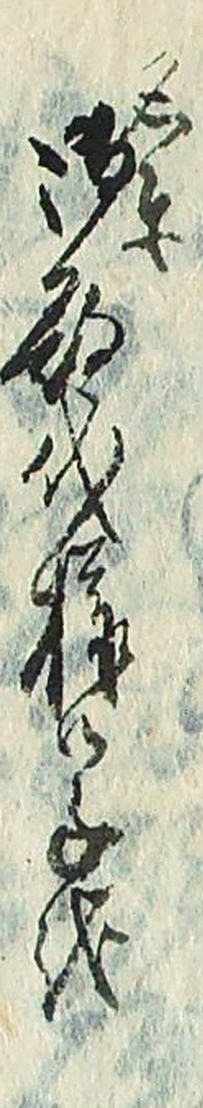御郡代様御手代
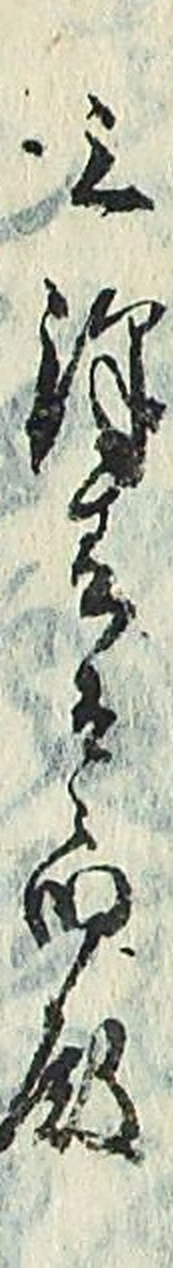三沢春太郎殿
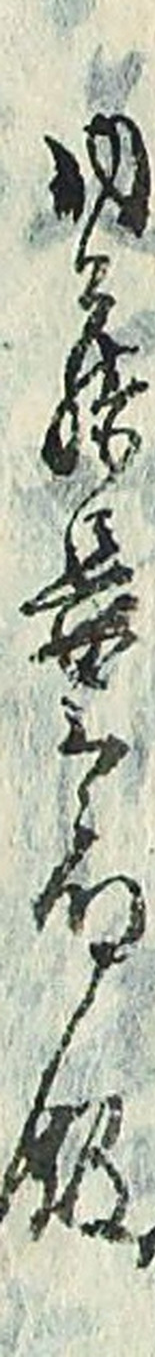内藤長三郎殿
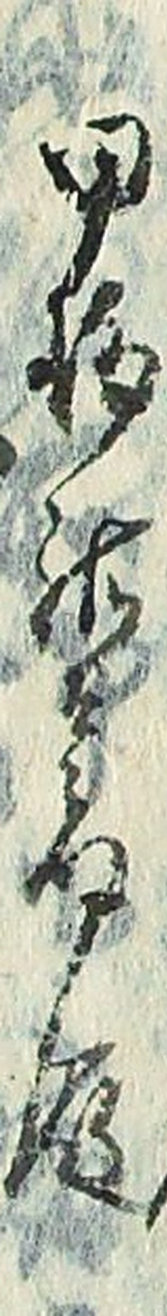田野祐太郎殿
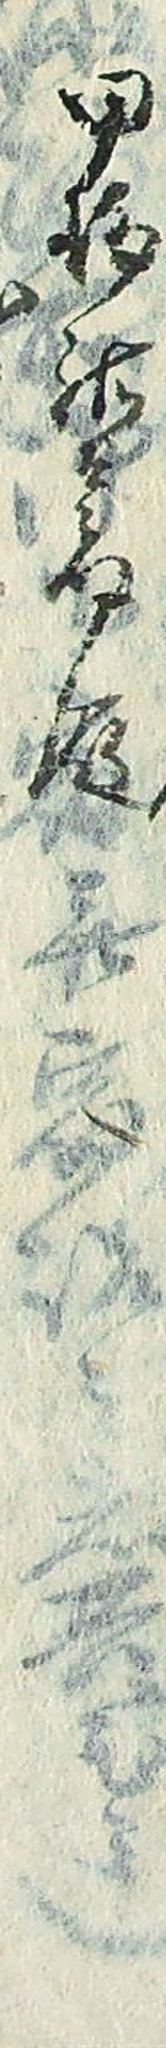田野祐太郎殿
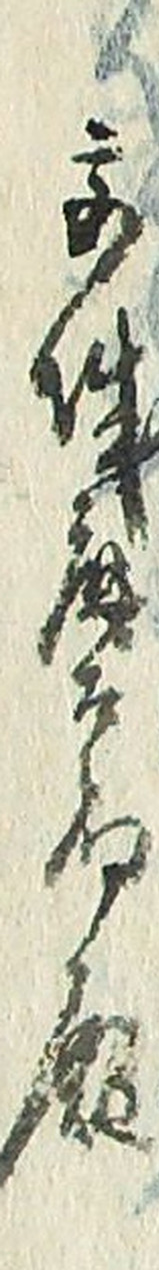宮城麻太郎殿

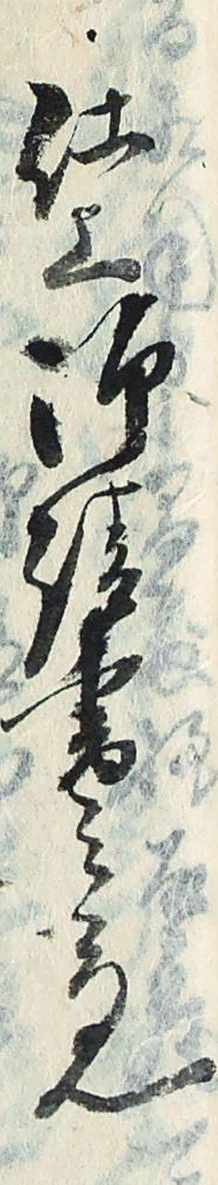仕上御請書之覚
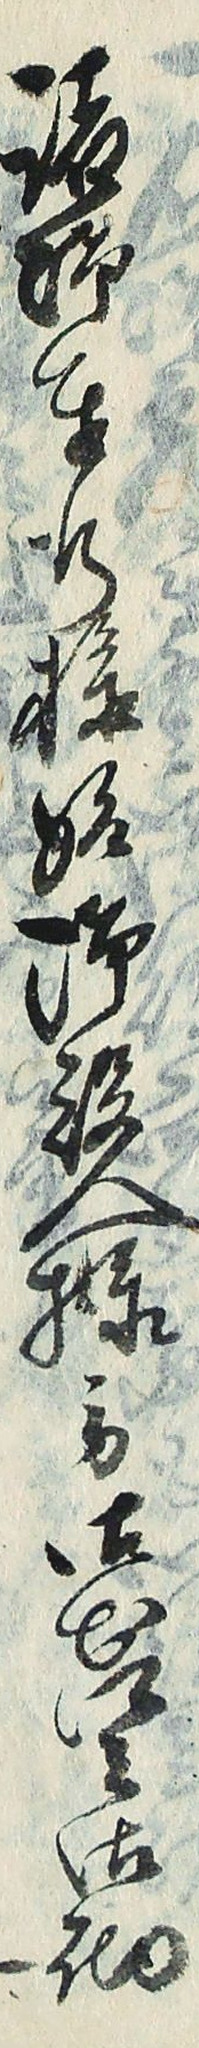諸奉行様始御役人様方御出郷之御砌
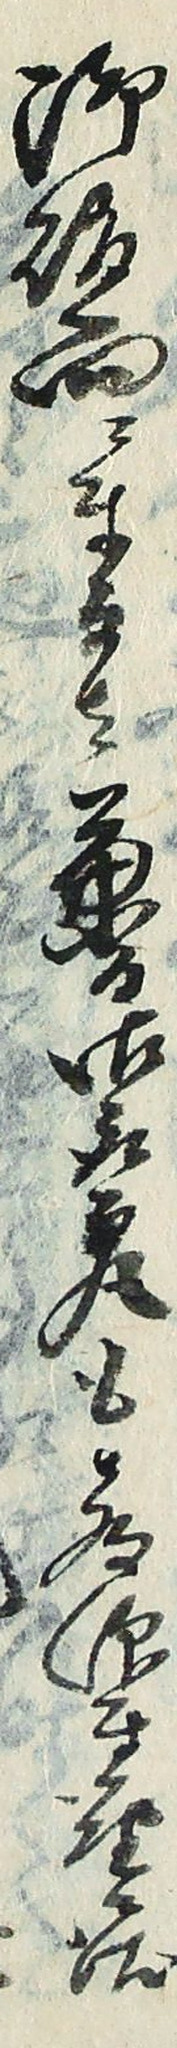御賄向に付而は兼而御取究も被為仰付御坐候所
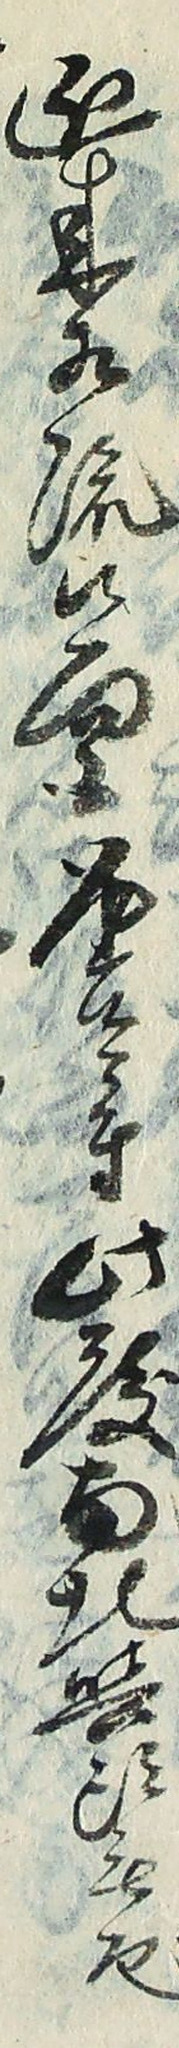近来相流候向も御坐候に付此度南北与頭庄屋
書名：諸御用御□受書控
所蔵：鳴門教育大学 Naruto University of Education
